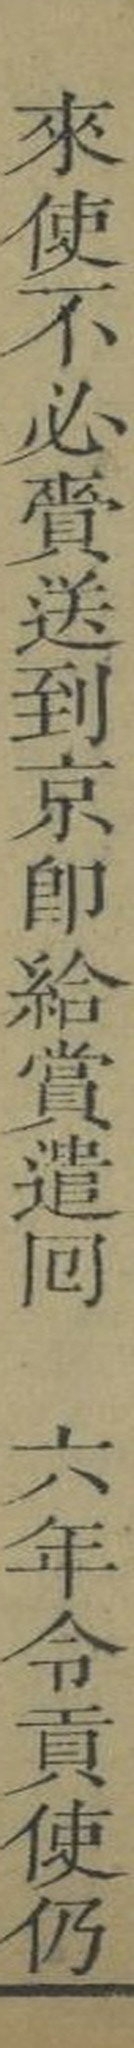来使不必賚送到京即給賞遣回六年令貢使仍
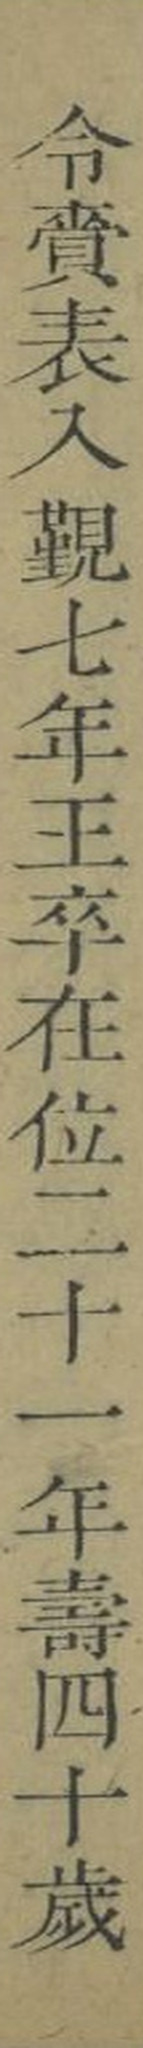令賚表入覲七年王卒在位二十一年寿四十歳
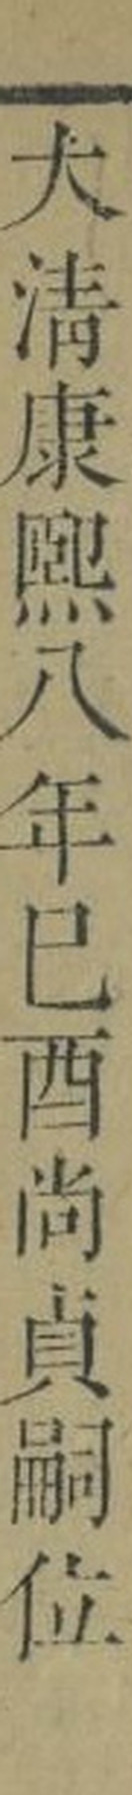大清康煕八年巳酉尚貞嗣位
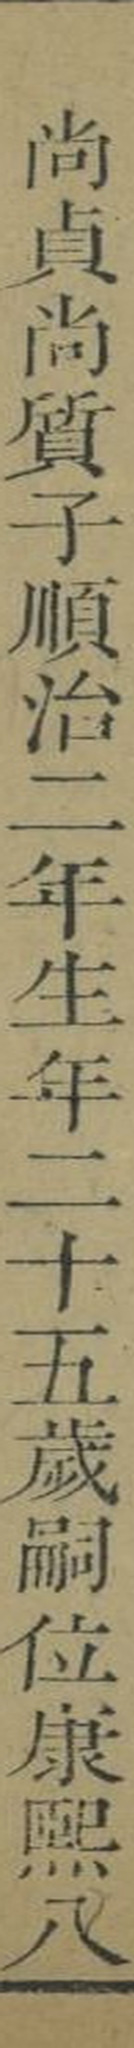尚貞尚質子順治二年生年二十五歳嗣位康煕八
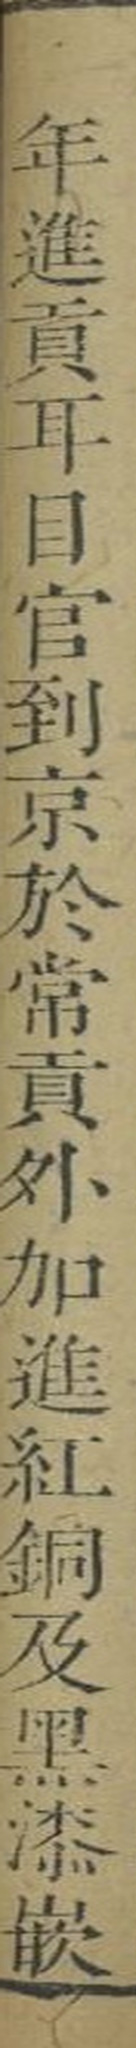年進貢耳目官到京於常貢外加進紅銅及黒漆嵌
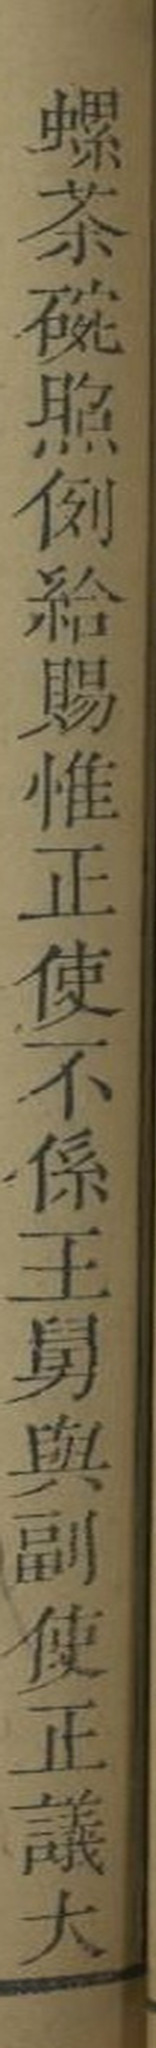螺茶碗照例給賜惟正使不係王舅与副使正議大
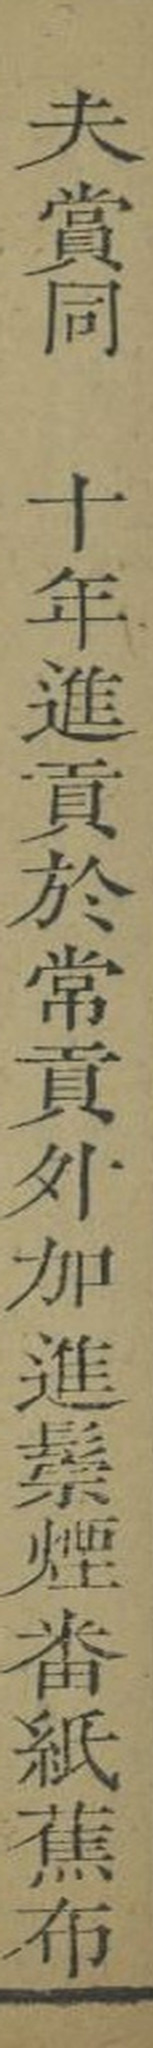夫賞同十年進貢於常貢外加進鬃煙番紙蕉布
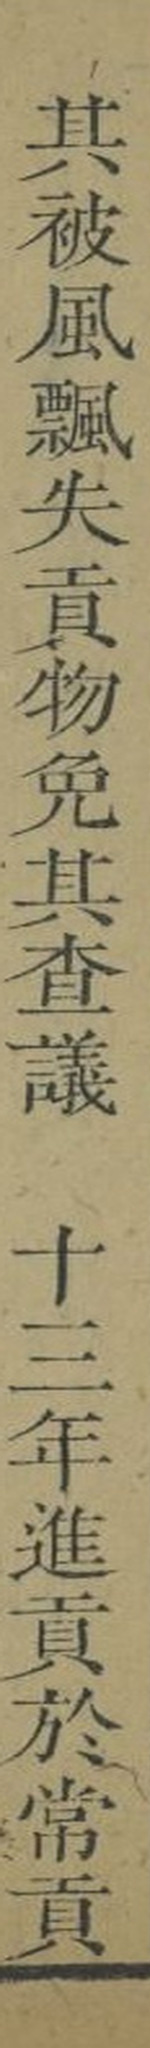其被風飄失貢物免其査議十三年進貢於常貢
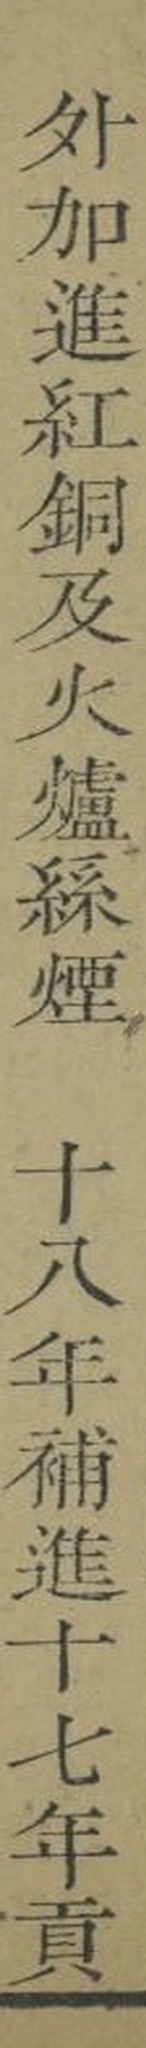外加進紅銅及火炉糸煙十八年補進十七年貢
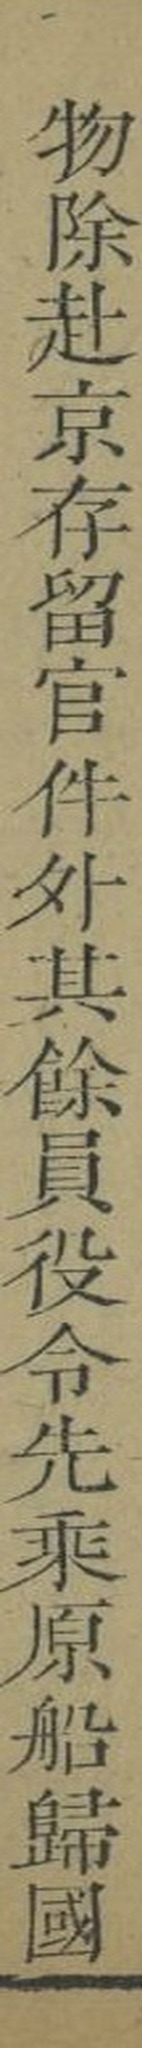物除赴京存留官件外其余員役令先乗原船帰国
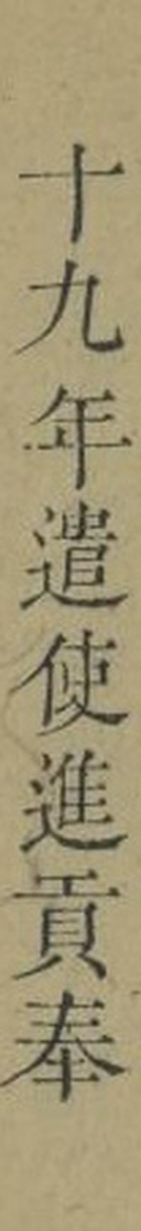十九年遣使進貢奉
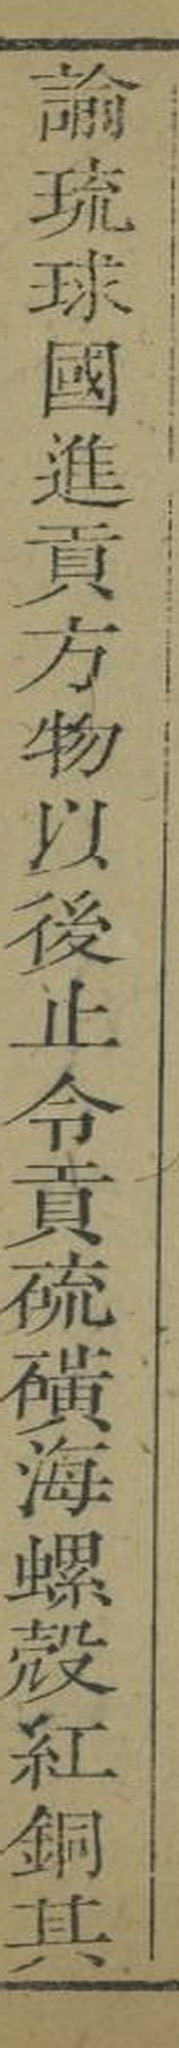諭琉球国進貢方物以後止令貢硫磺海螺殻紅銅其
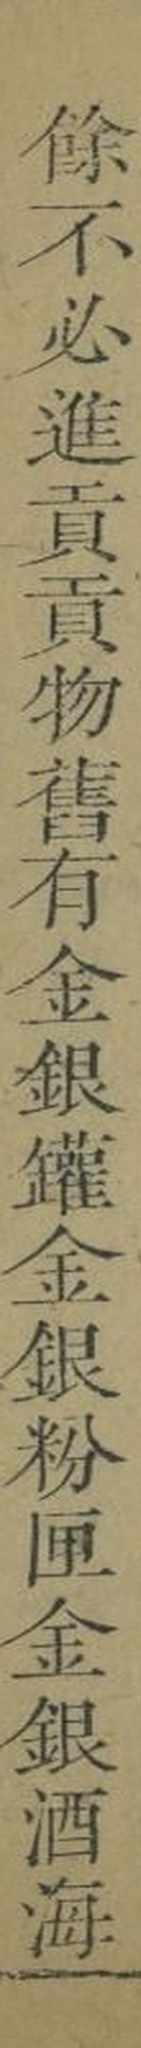余不必進貢貢物旧有金銀缶金銀粉匣金銀酒海
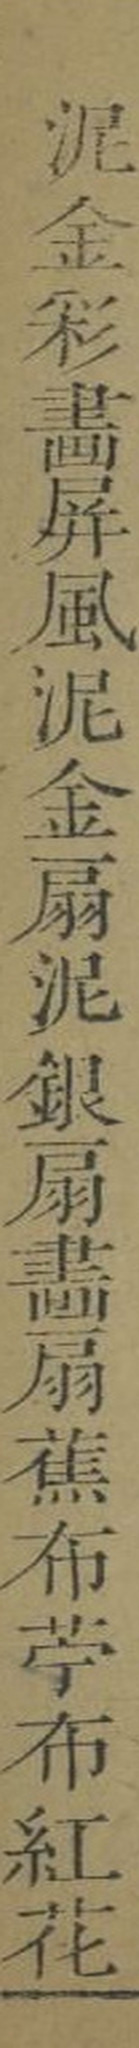泥金彩画屏風泥金扇泥銀扇画扇蕉布苧布紅花

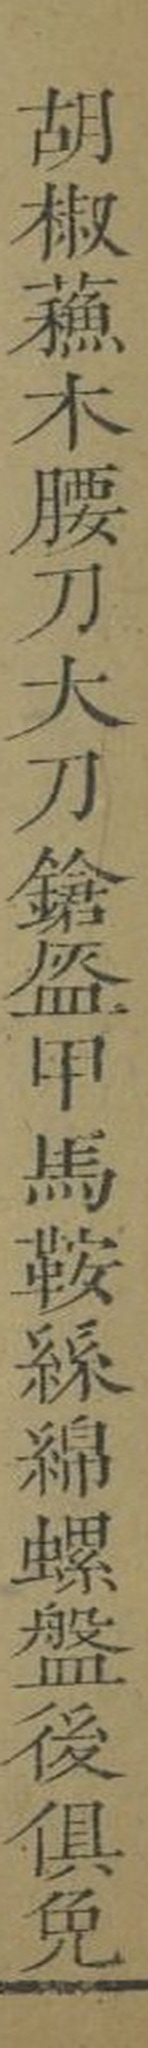胡椒蘇木腰刀大刀鎗盔甲馬鞍糸綿螺盤後俱免
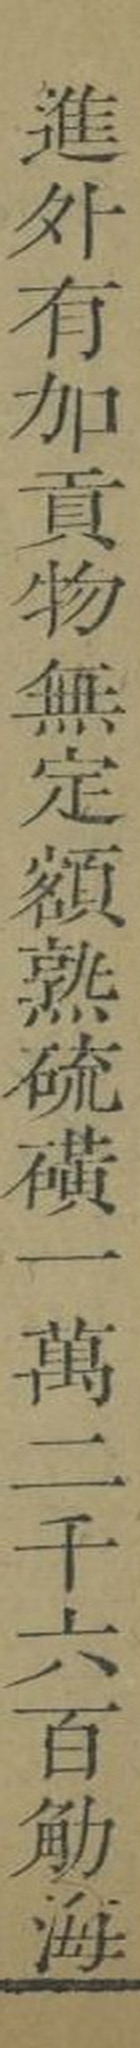進外有加貢物無定額熟硫磺一万二千六百觔海
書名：中山伝信録 巻四
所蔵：University of the Ryukyus Library
